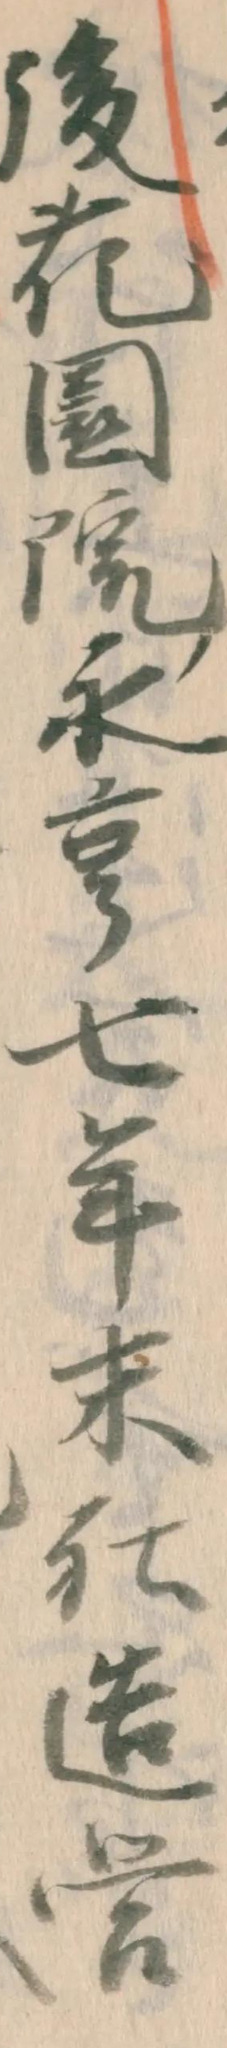後花園院永亨七年末社造営
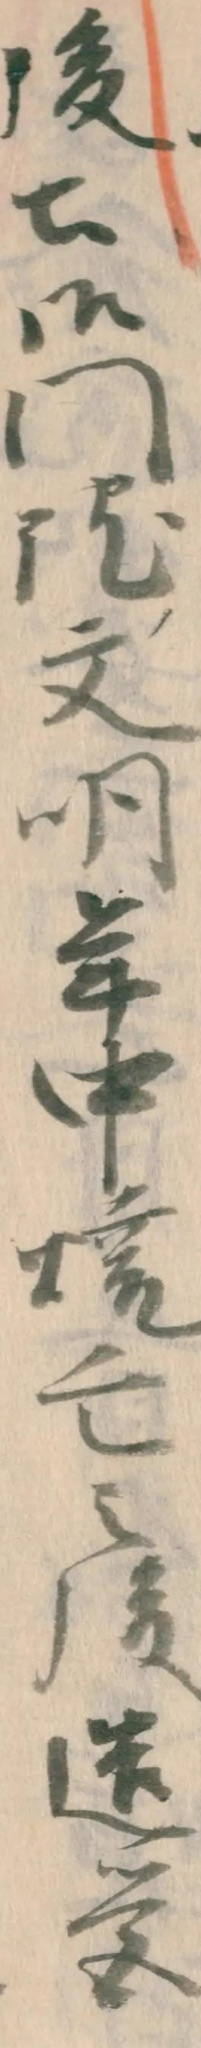後土御門院文明年中焼亡之後造営
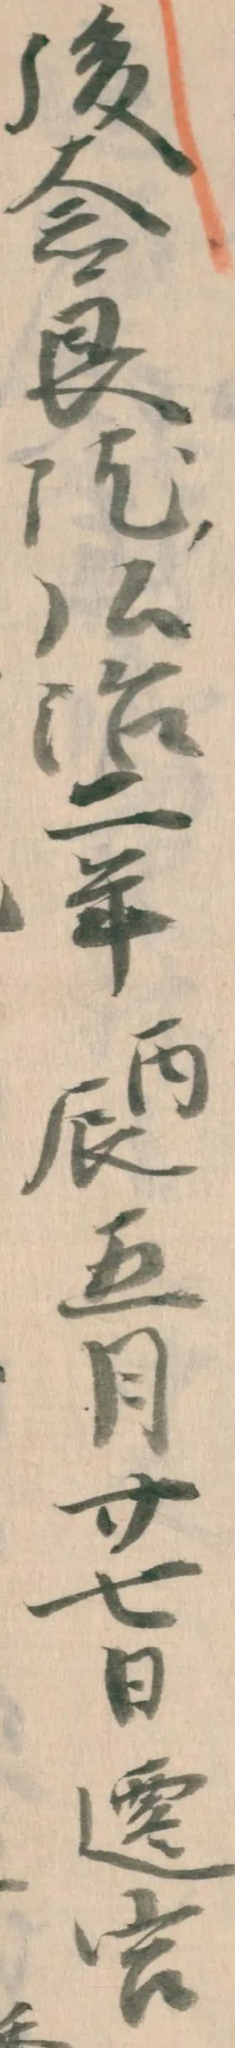後奈良院弘治二年丙辰五月廿七日遷宮
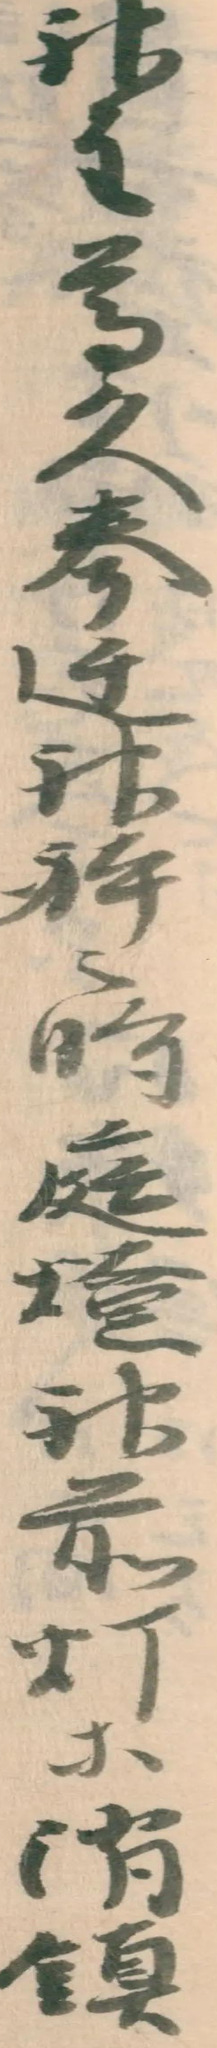神主尊久奉遷神体之時庭燈神前灯等消鎮
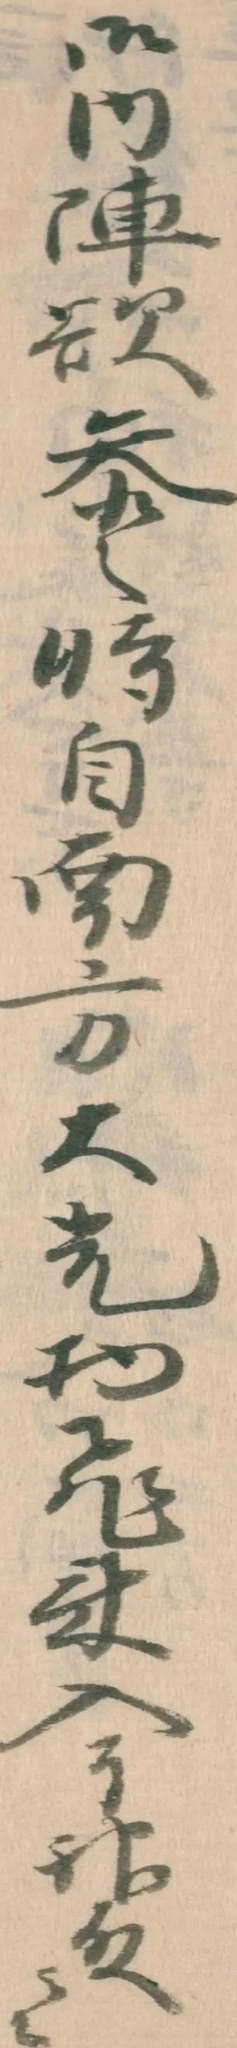御内陣欲参之時自南方大光物飛来入于神殿云々
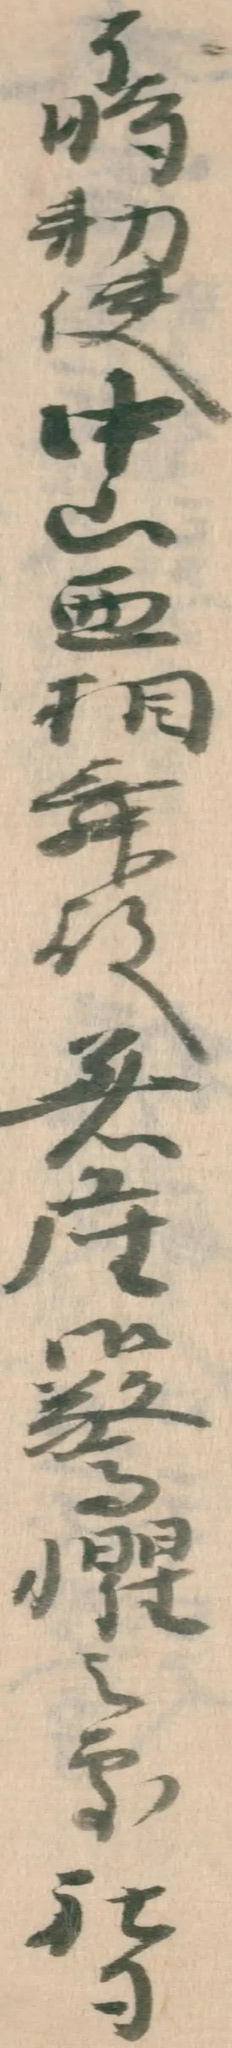于時勅使中山亜相舞殿着座御驚懼之処社司
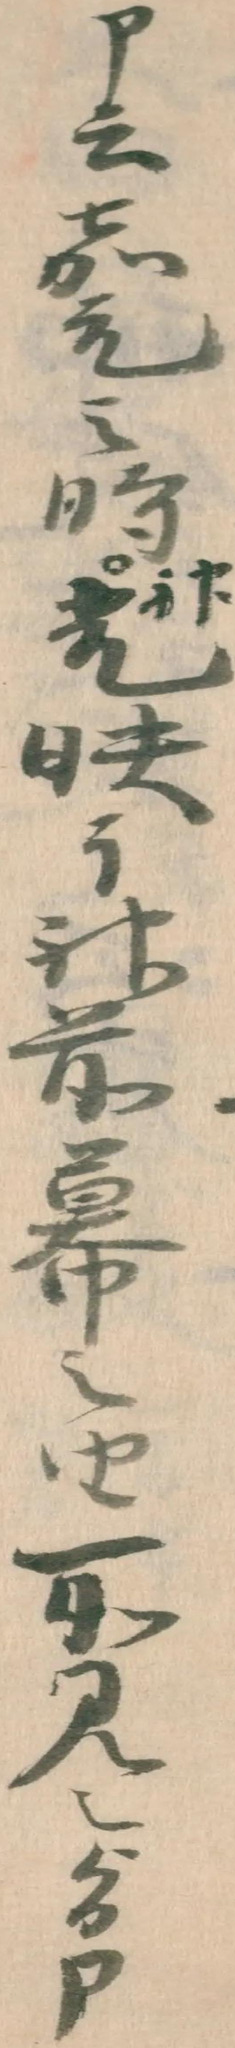申云嘉元之時◦光映于神前幕之由所見之旨申
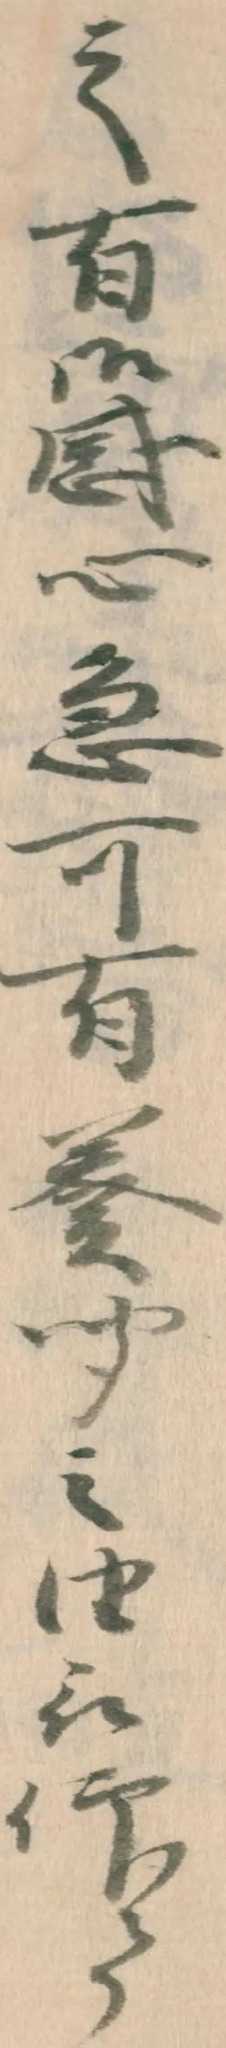之有御感心急可有奏聞之由被仰候
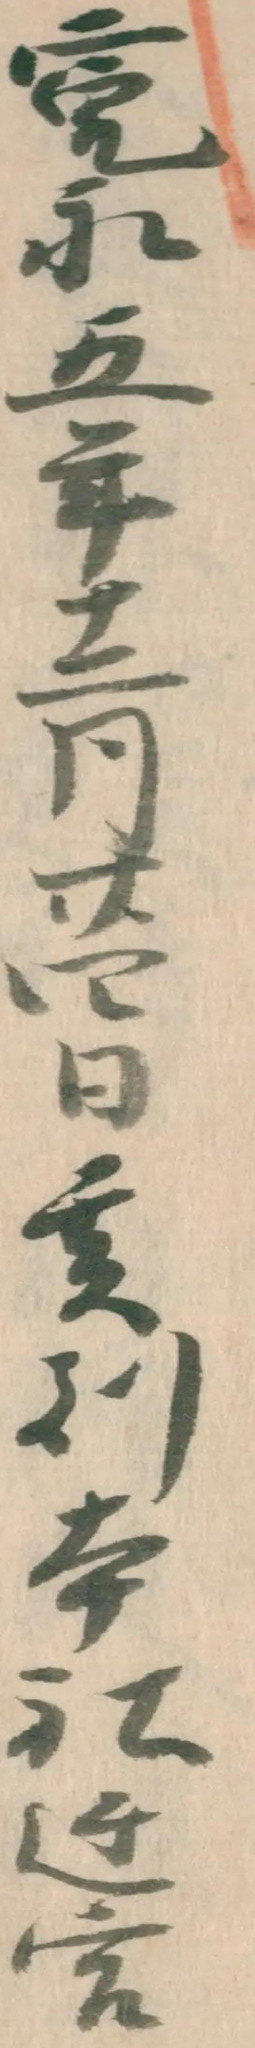寛永五年十二月廿四日亥刻本社遷宮
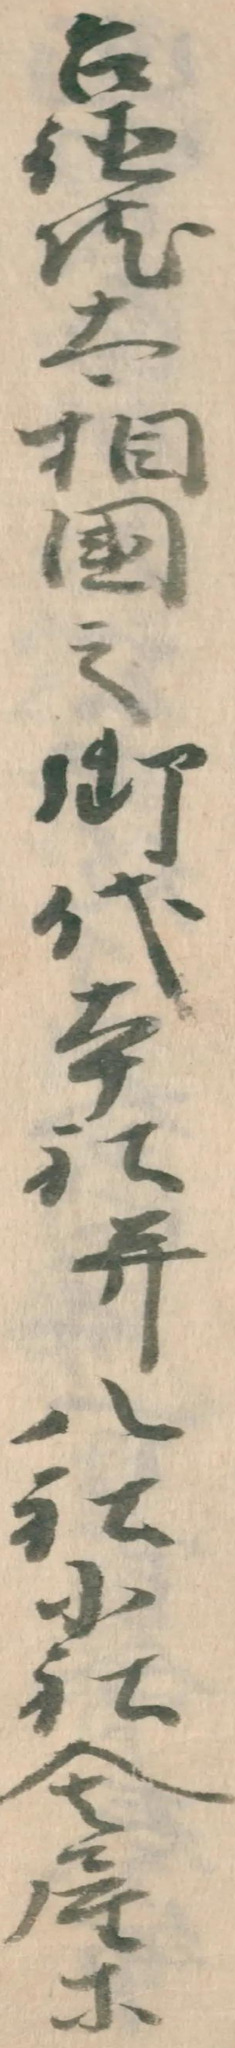台徳院太相国之御代本社并八社小社舎屋等
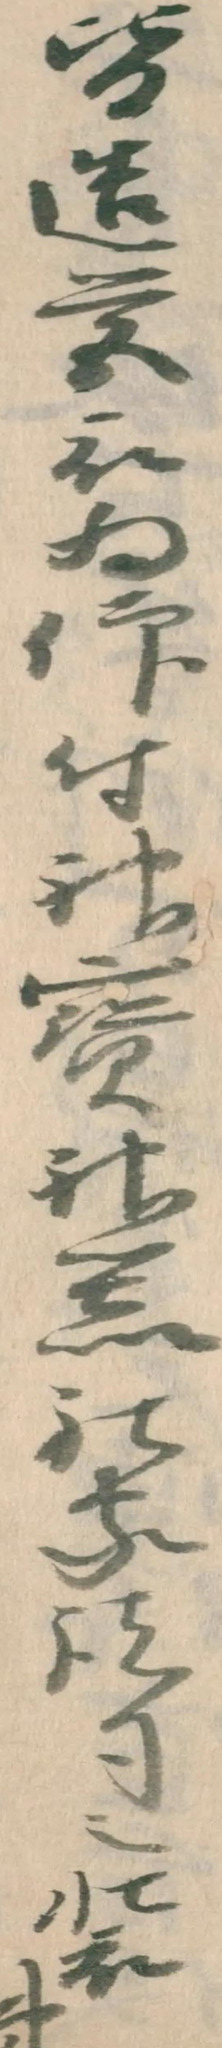皆造営被為仰付神宝神器社家諸司之装束
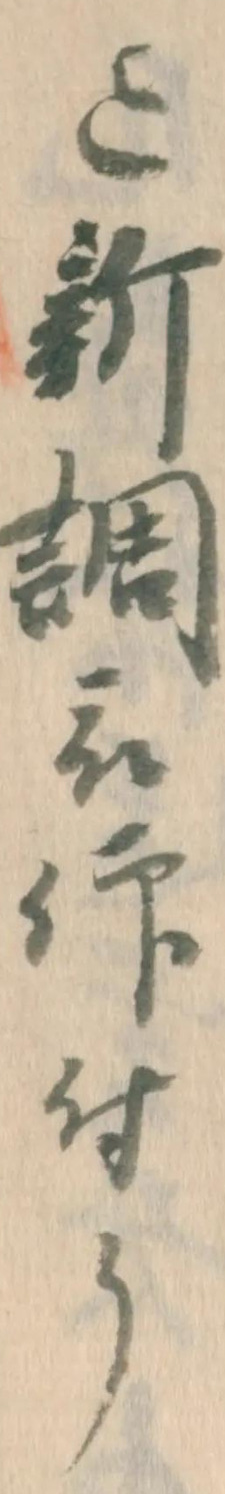迄新調被仰付候
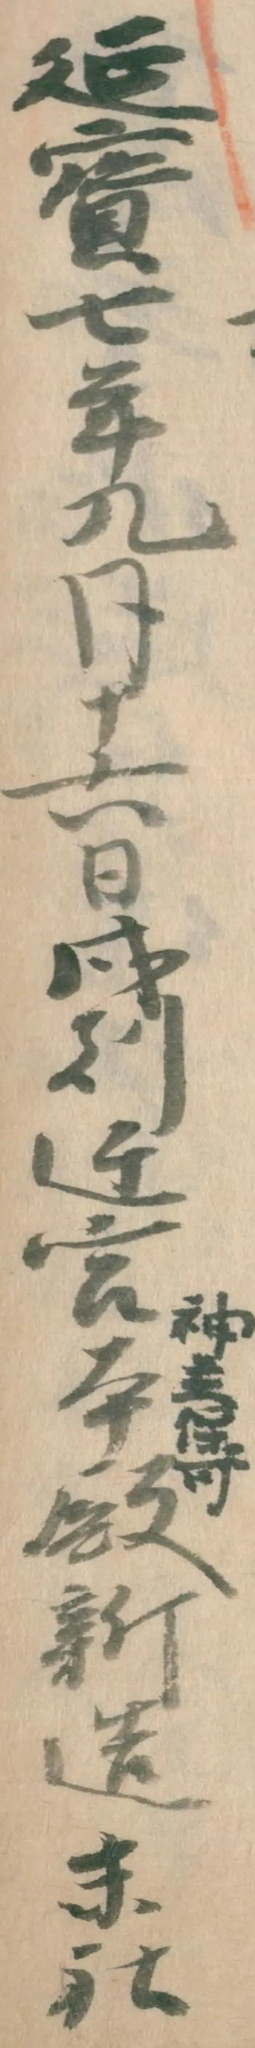延宝七年九月十六日戌刻遷宮◦本殿新造末社

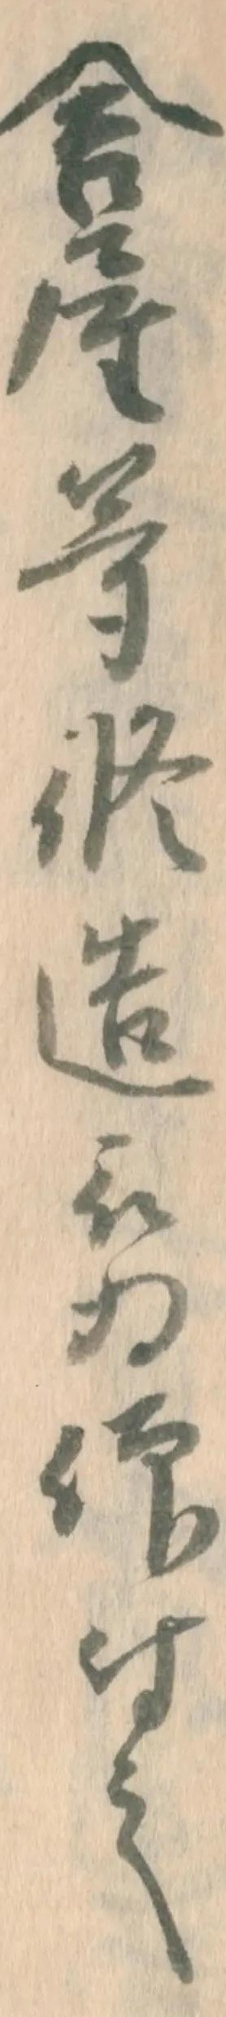舎屋等修造被為仰付之
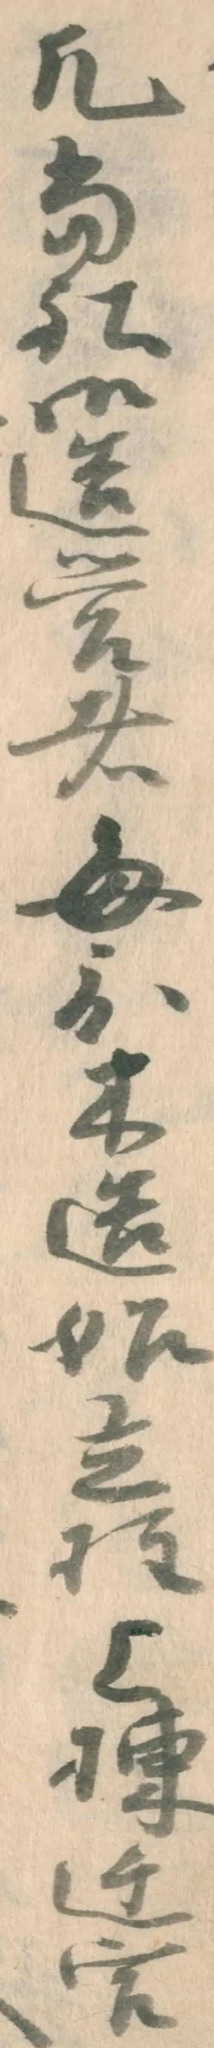凡当社御造営は毎度木造始立柱上棟遷宮
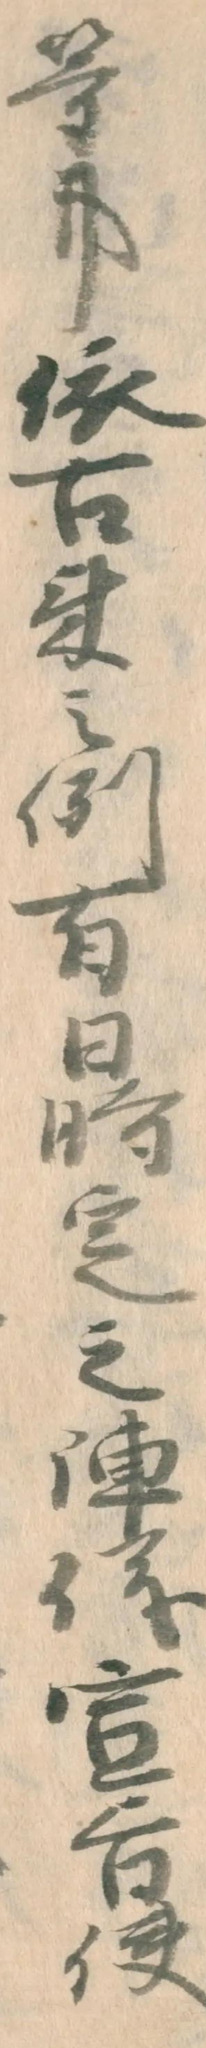等事依古来之例有日時定之陣儀宣旨使
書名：賀茂社記録. 第1冊
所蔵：国立国会図書館 National Diet Library, JAPAN
